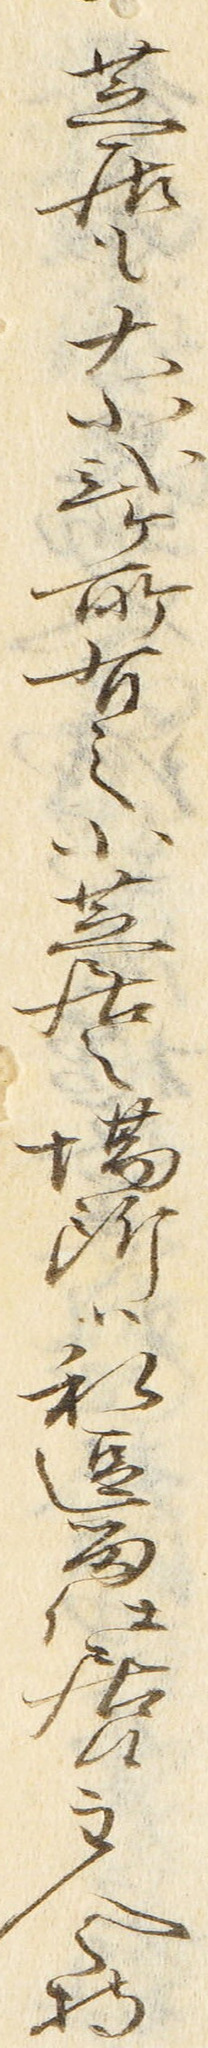一芝居も大小弐ケ所有之小芝居之場所は私逗留仕居候主人之持
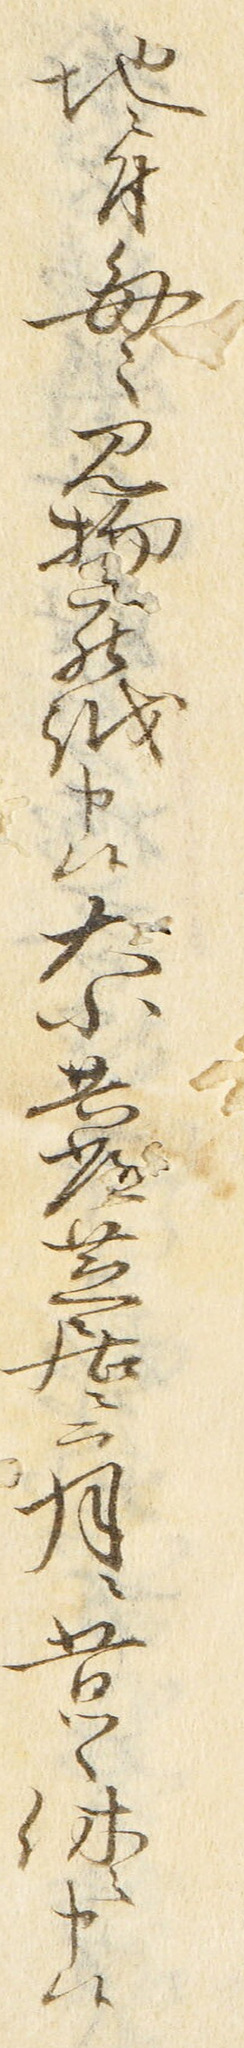地に付毎々見物に罷越申候大小共道芝居に而月に五日ツツ休み申候
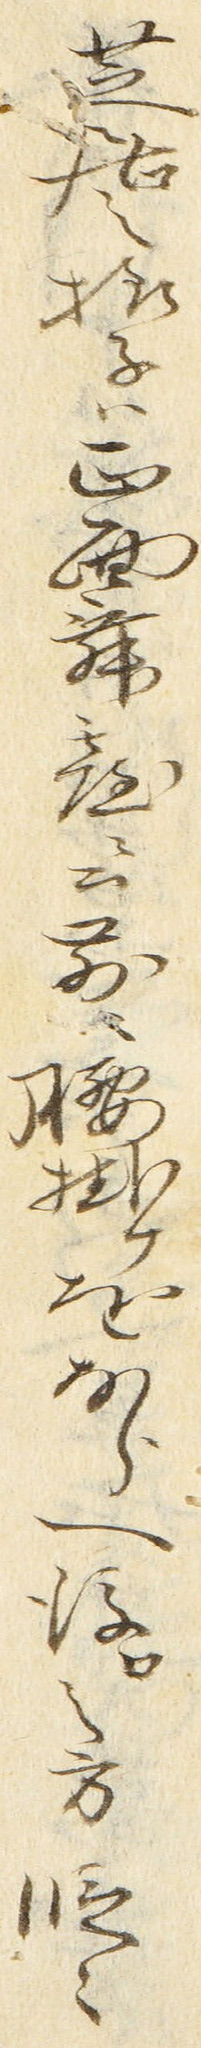芝居之様子は正面舞台に而前に腰掛けをならへ後ろ之方段々
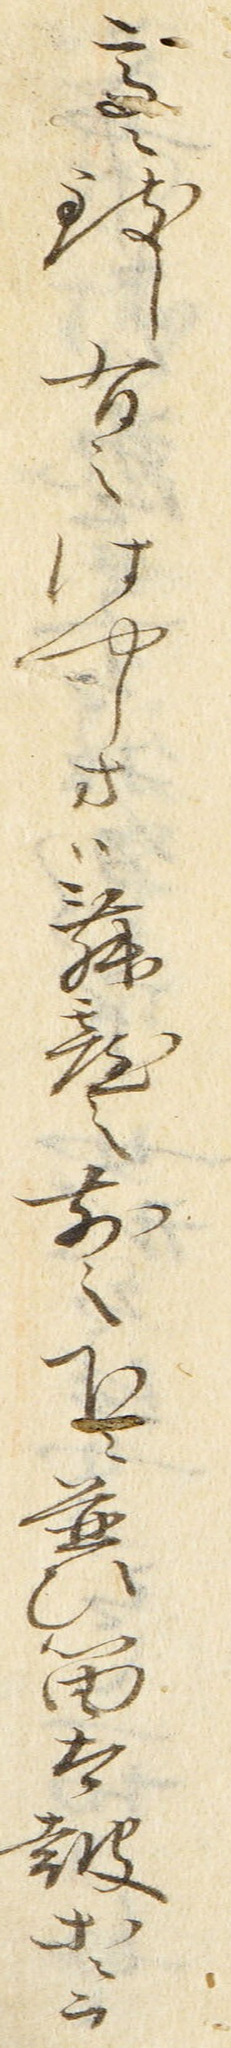高に致し有之はやし方は舞台之まえ之下に並ひ笛太鼓等に而

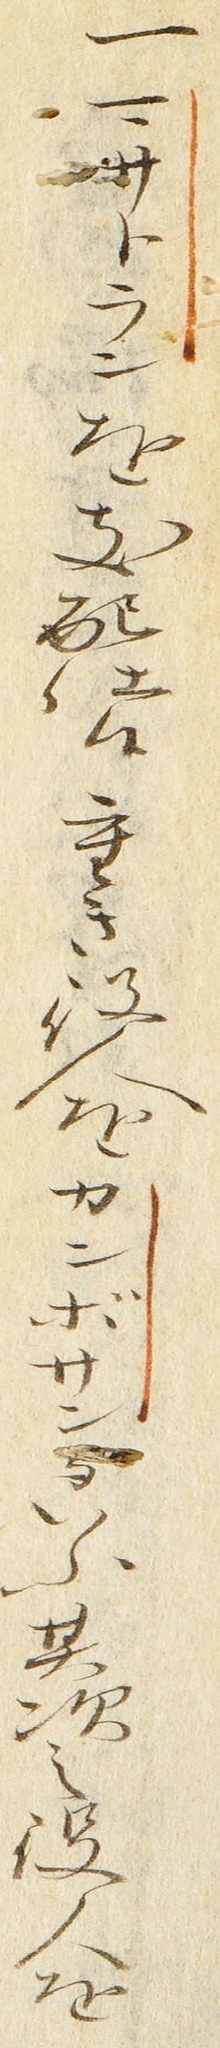一マサトランを支配仕候重き役人をカンボサンといふ其次之役人を
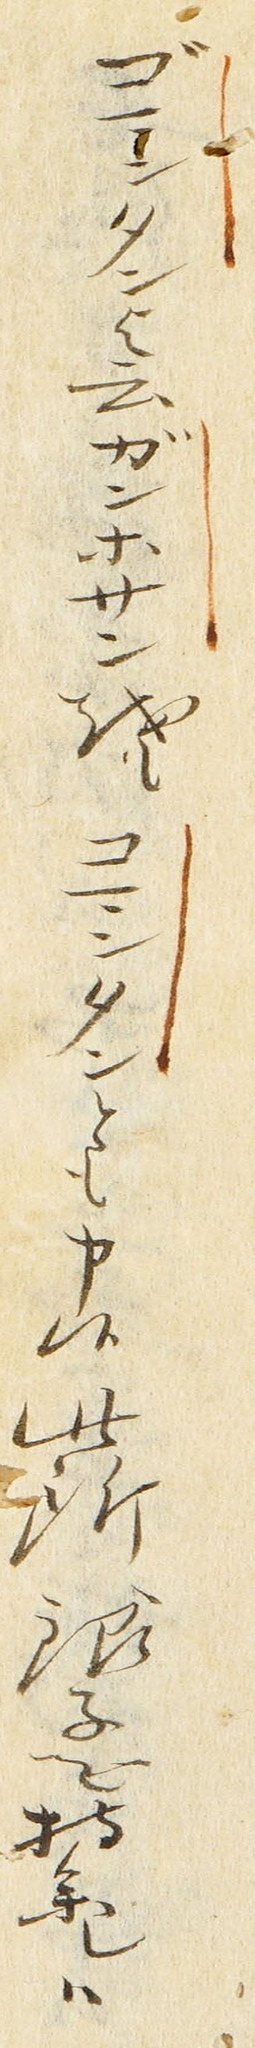ゴマンタンと云ガンホサンをもコマンタンとも申候此所銀子を持参しは
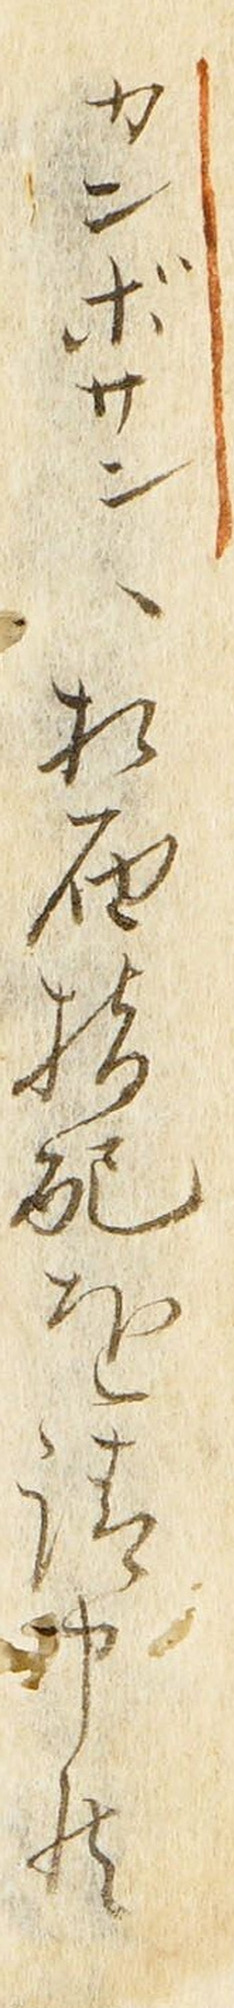カンボサンへ相届指配を請申候
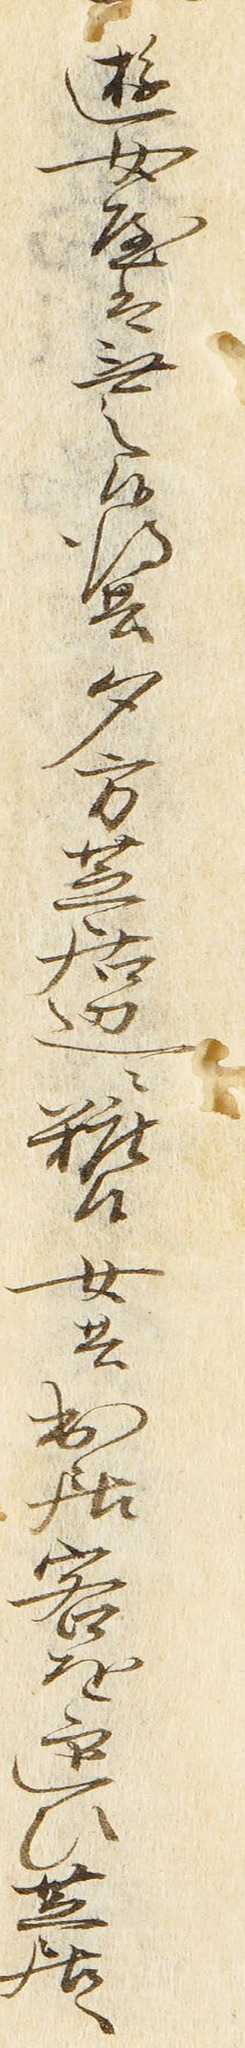一遊女屋は無之候得共夕方芝居辺に粧候女共出居客を迎ひ芝居へ
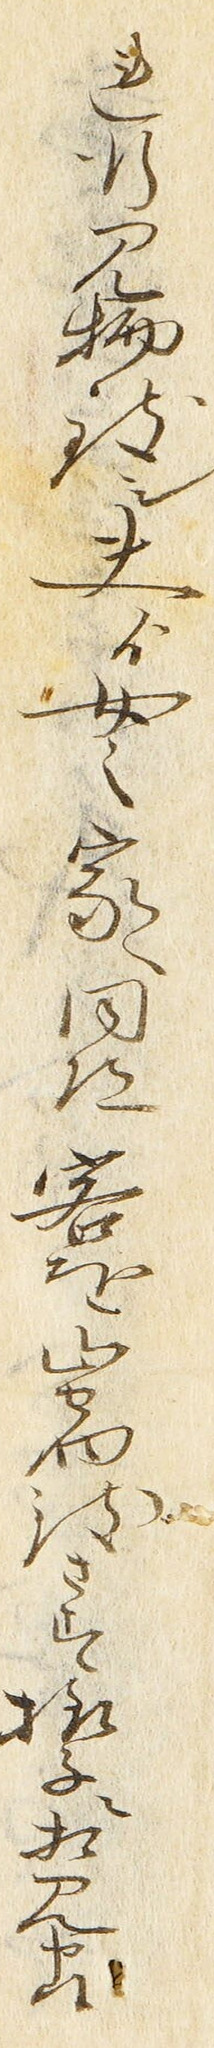連行見物致し夫ゟ女の家へ同道客を止宿致さす様子に相見申候
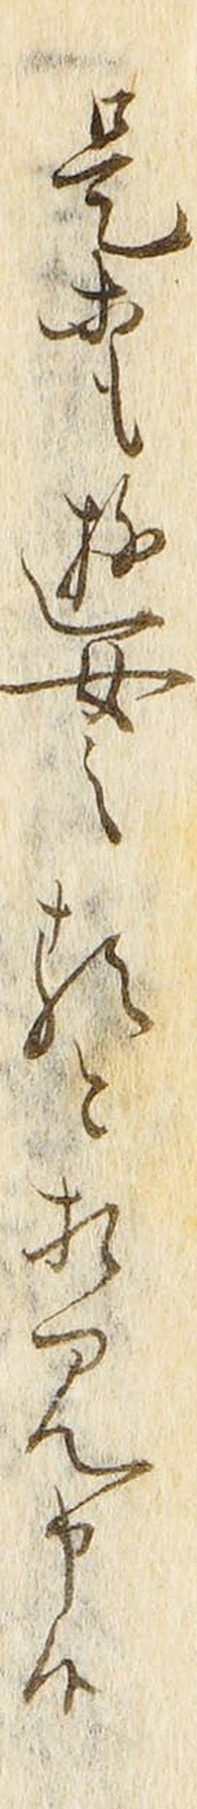是等も遊女之類と相見申候
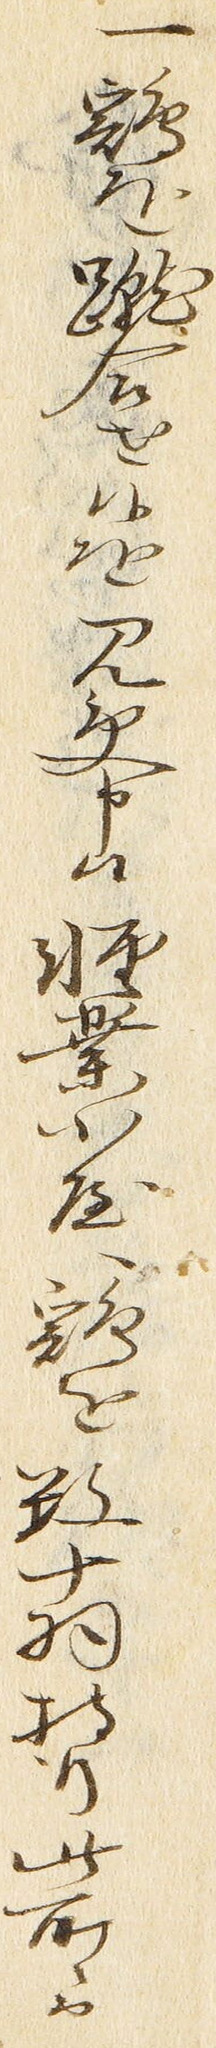一鶏を蹴合せ候を見受申候軽業小屋へ鶏を数十羽持行此所に而
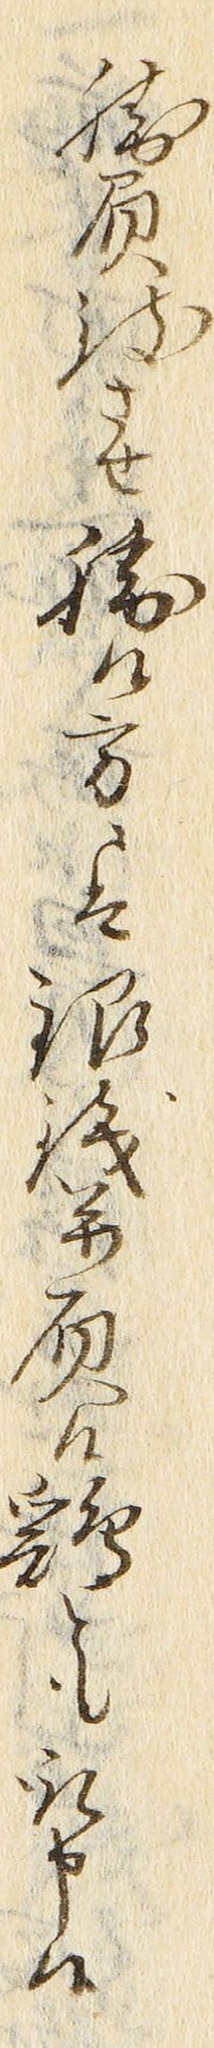勝負致させ勝候方には銀戦等負候鶏とも取申候
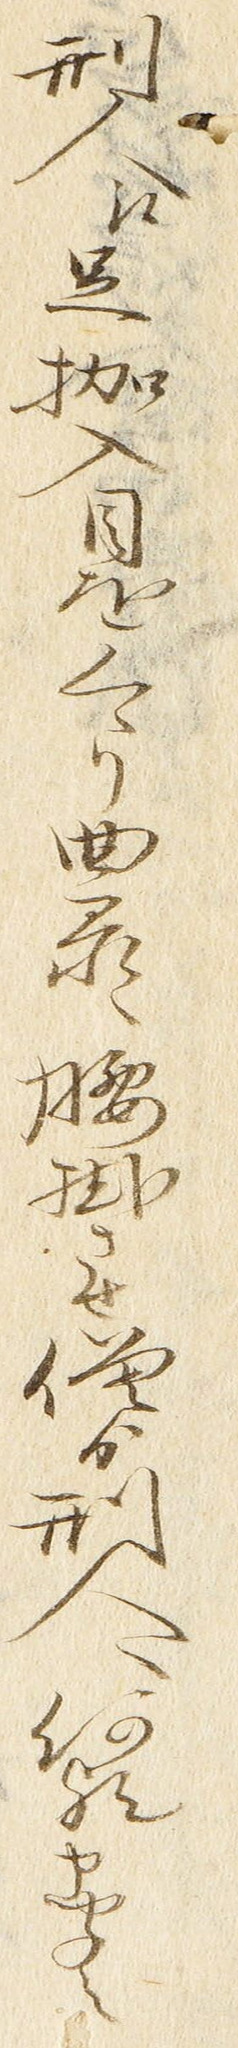刑人江足枷入目をくくり曲彔へ腰掛させ僧ゟ刑人何経申聞之
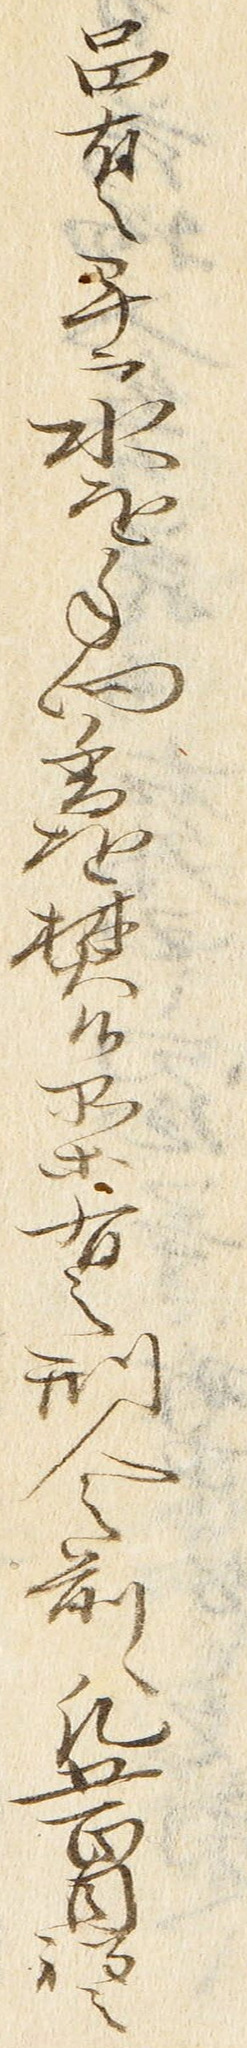品有之？而水を手向香を焚候品等有之刑人之前は凡五百目程之
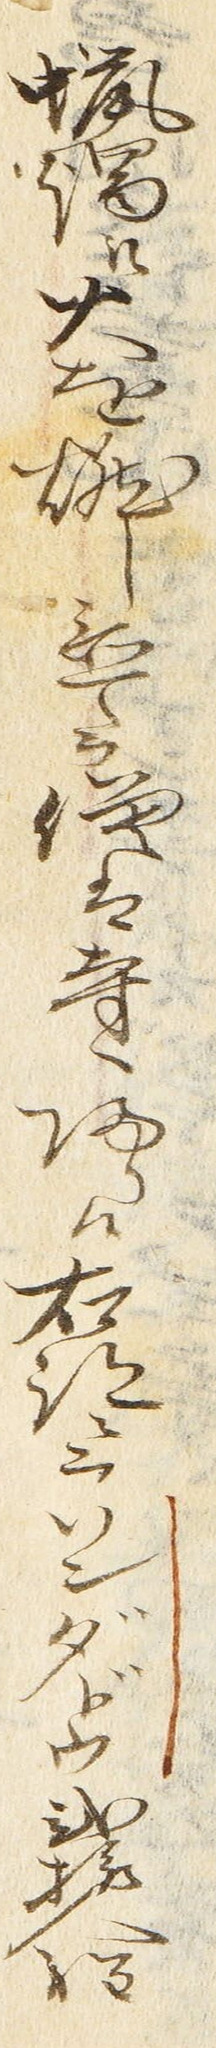蝋燭江火を燃し置候而僧は寺へ帰り候右請に而リンダドウ弐拾人程
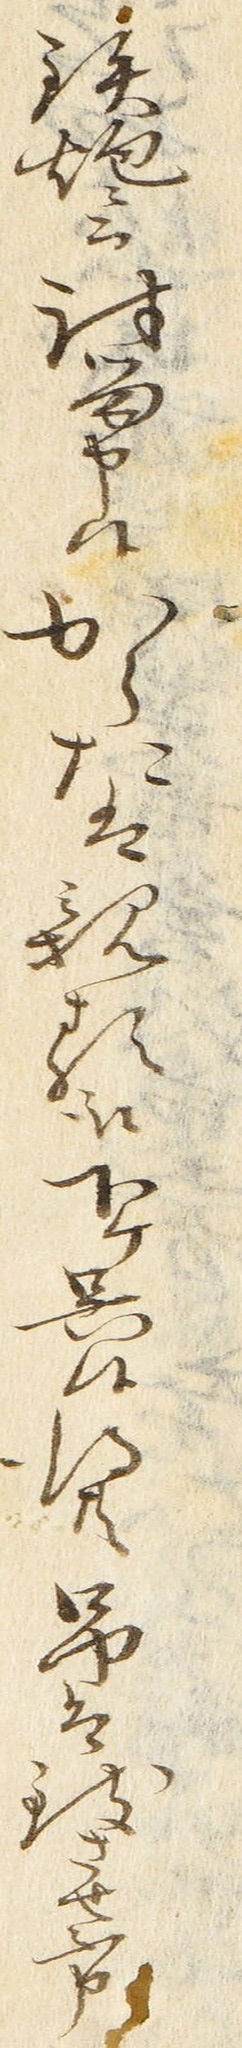鉄砲に而討当申候からたは親類へ下ケ呉候得共吊は致させ不申
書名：漂流人弥市之記
